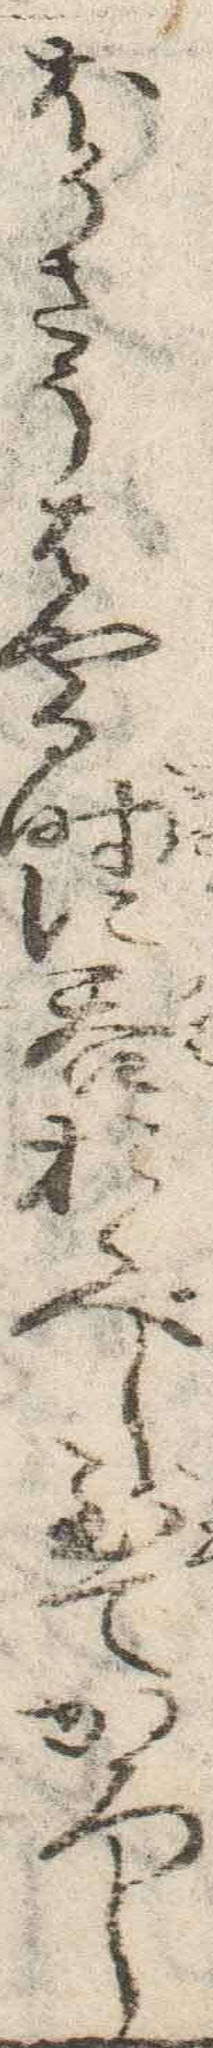ほうさうはやる時に呑おくべし至てかろし
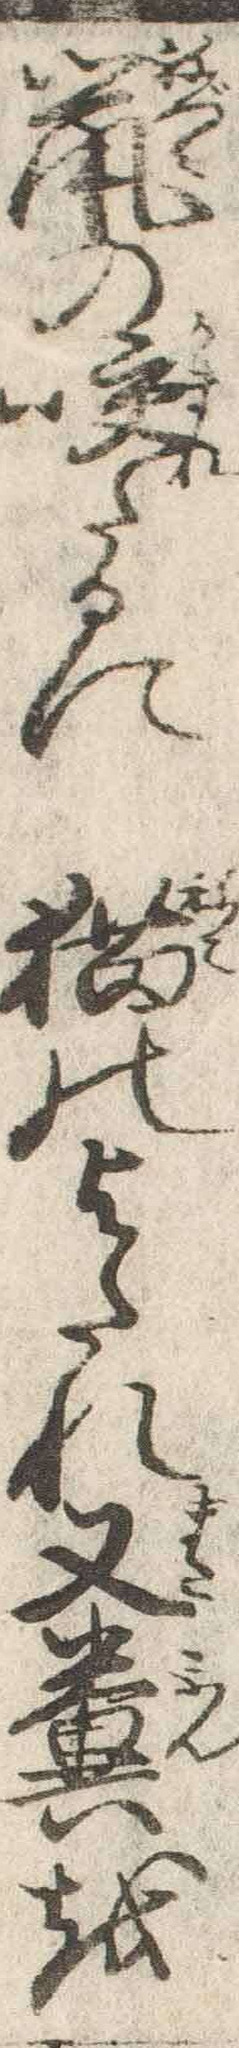鼠の咬たるに猫のよたれ又糞を鼠
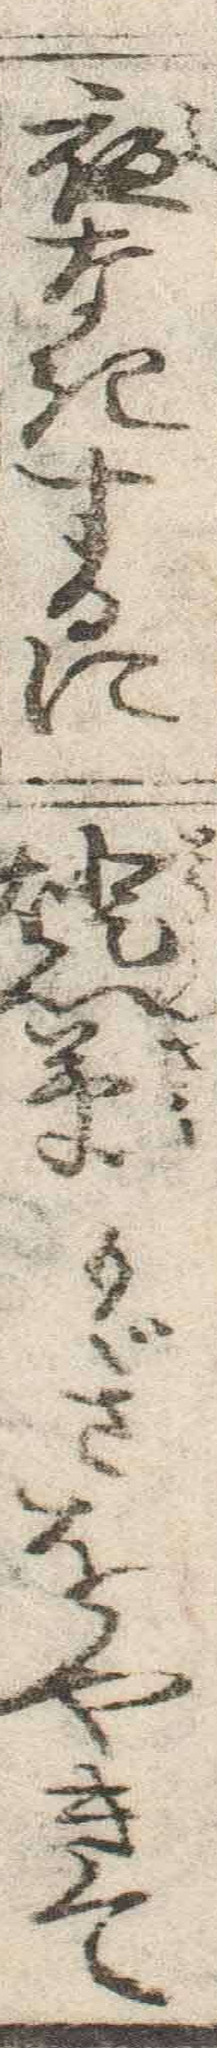夜なきするに灯心草もぐさをやきて
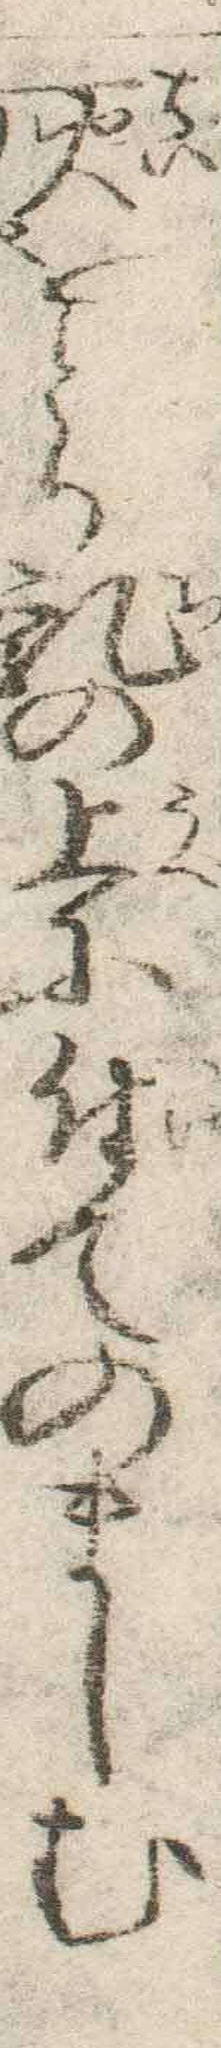灰をとり乳の上に付てのましむ
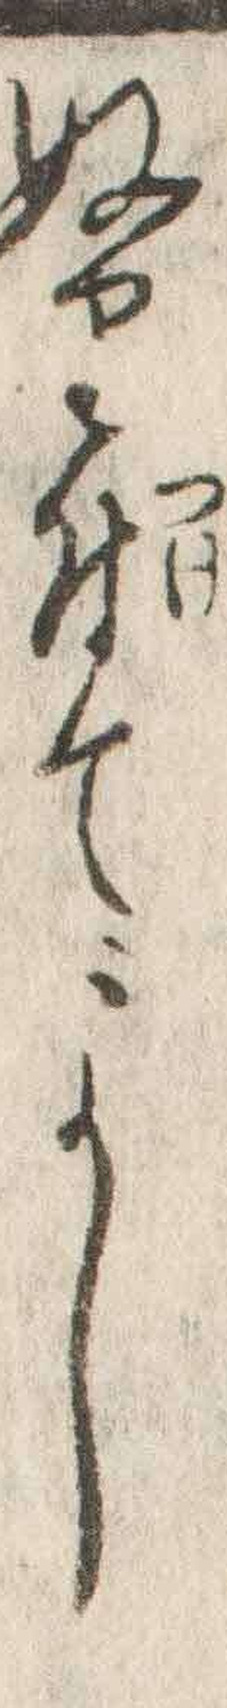ぬり付てよし
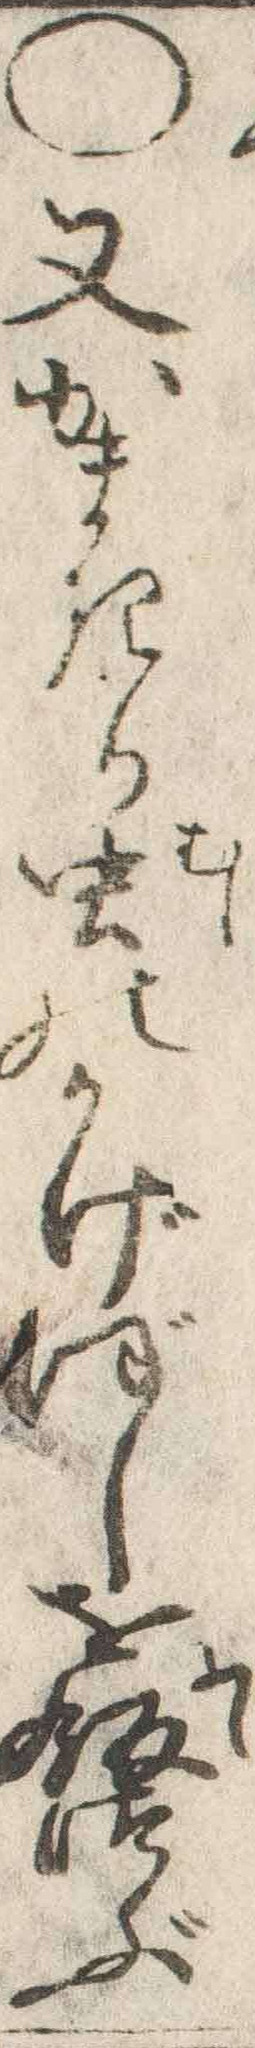〇又かまきり虫のかげぼしを飯つぶ
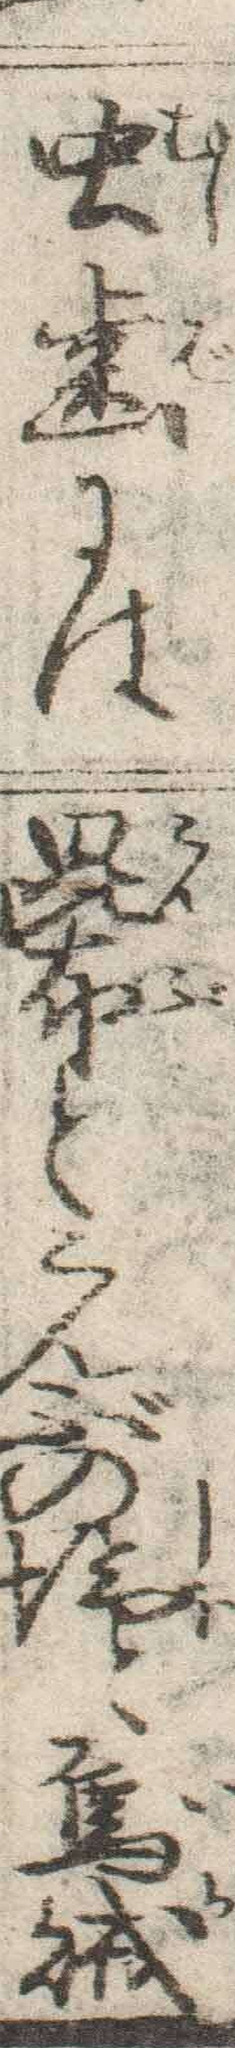虫歯には昆布とこんこんぶの塩と烏賊
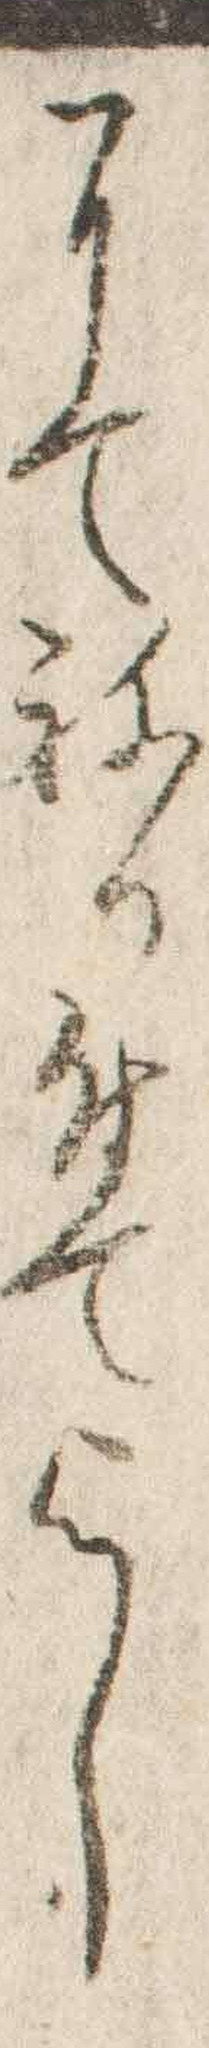にてねり付けてよし
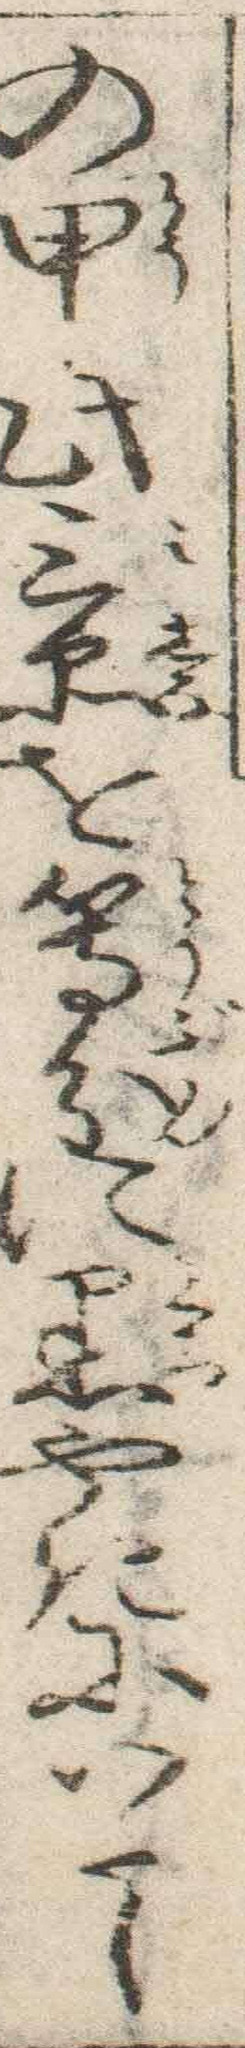の甲此三品を等分に黒やきにいたし
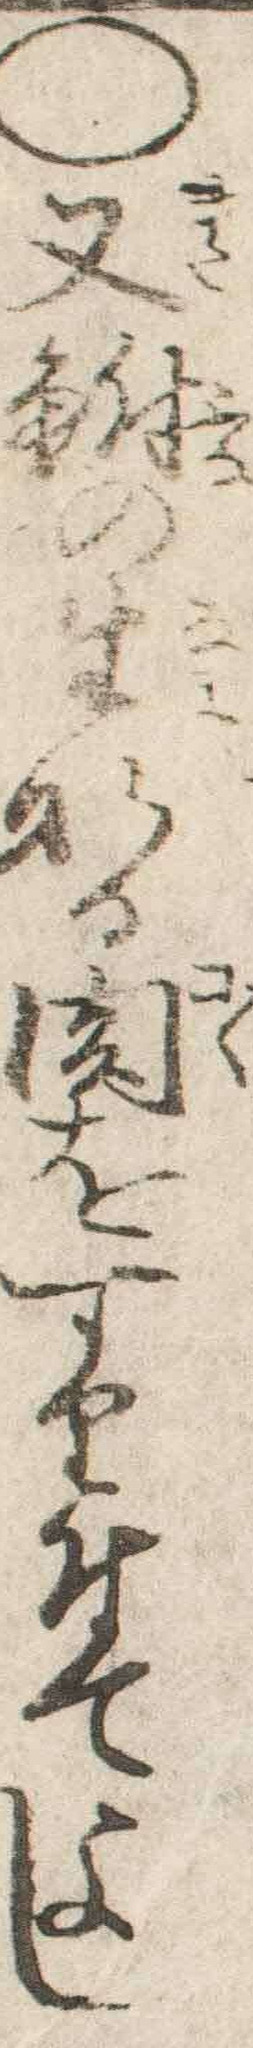〇又鮒の生なる肉をすり付てよし
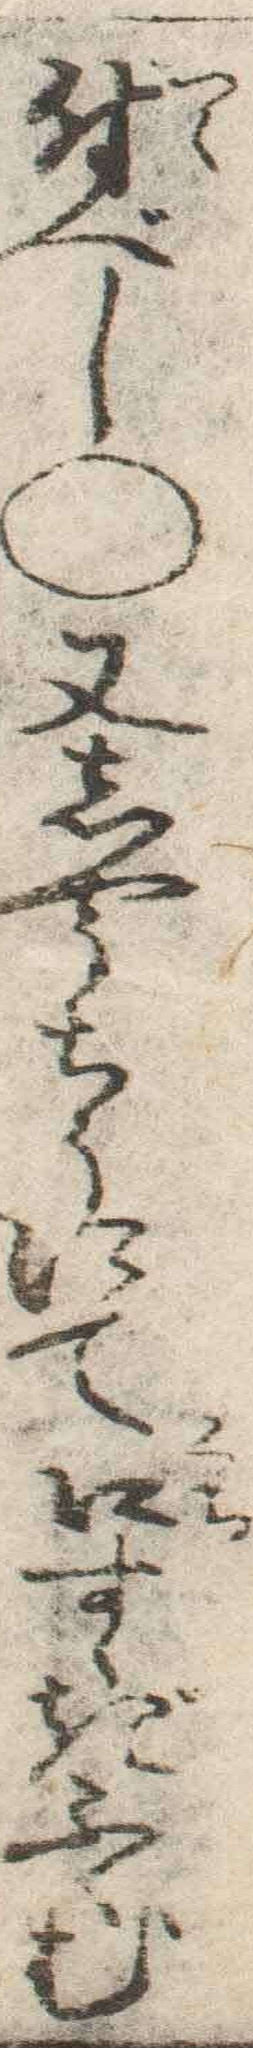付べし〇又しやうちうにて口すゝぎふくむ
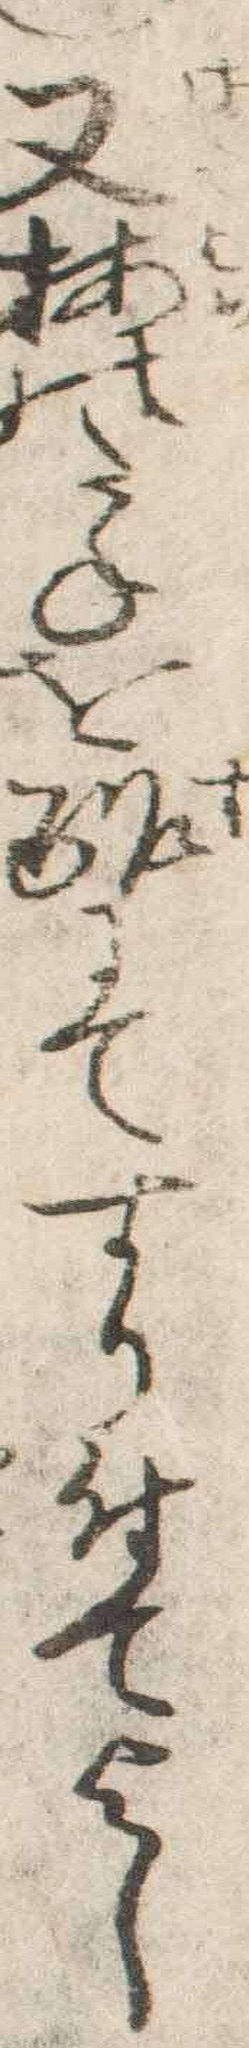〇又梅のたねを酢にてすり付てよし
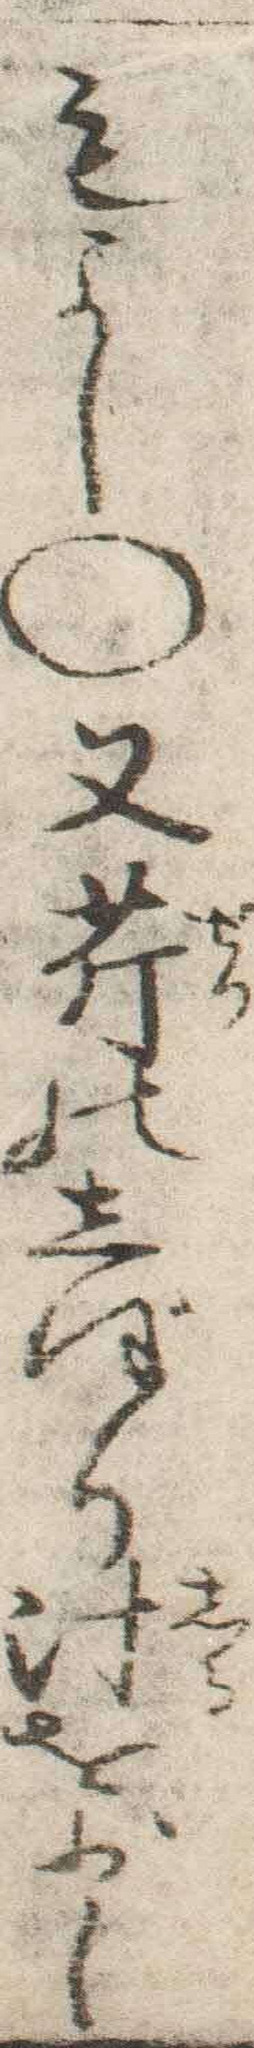もよし〇又芹のしぼり汁を少し
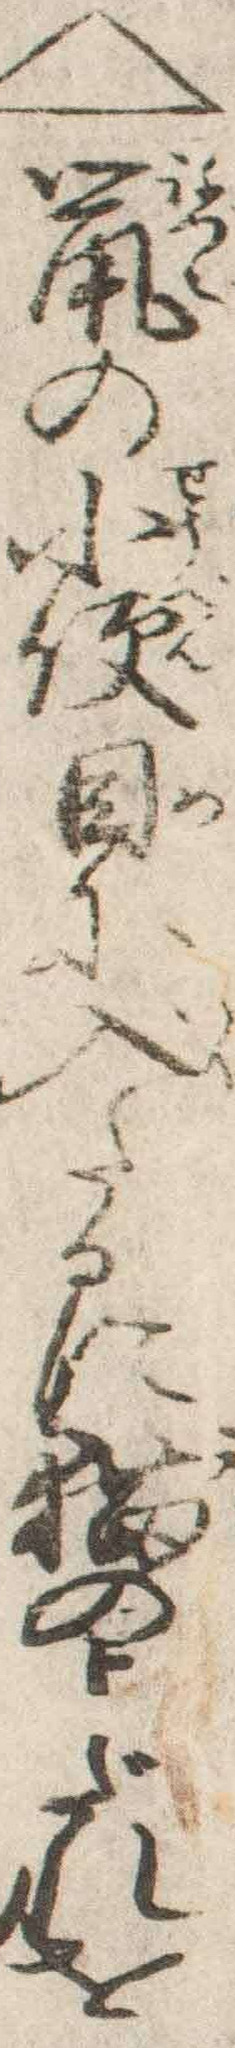△鼠の小便目に入たるに猫のよだれを
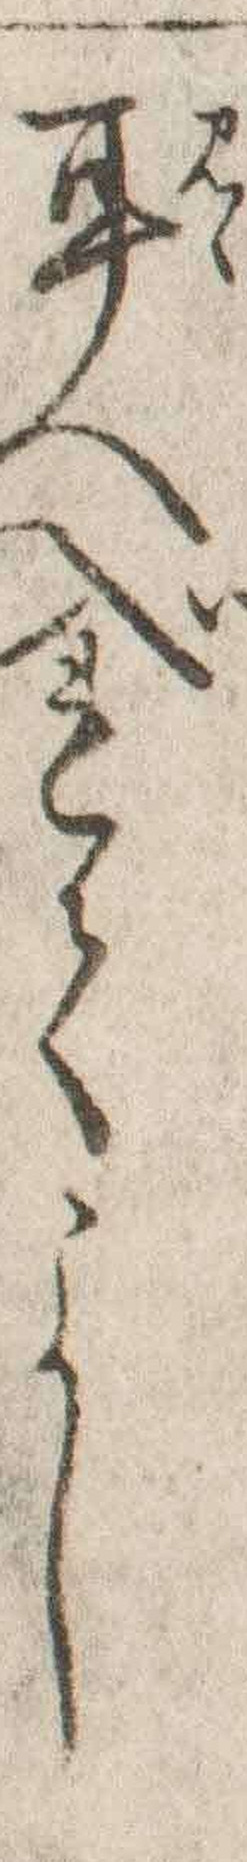耳へ入れてよし
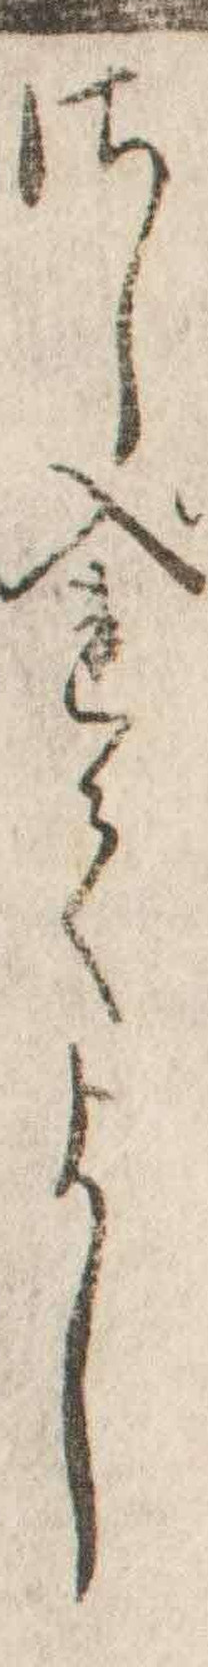さし入れてよし
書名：撫育草
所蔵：東京学芸大学附属図書館 国文学研究資料館
